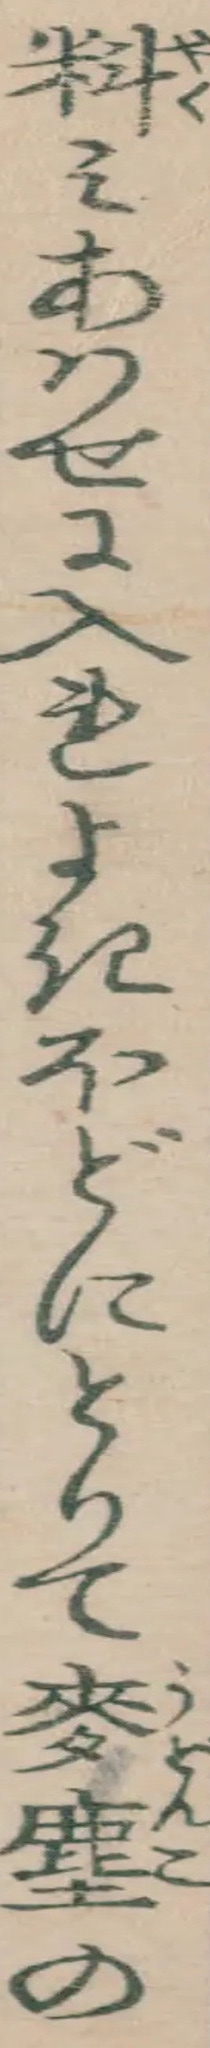料みあはせに入れよきほどにとりて麦塵の
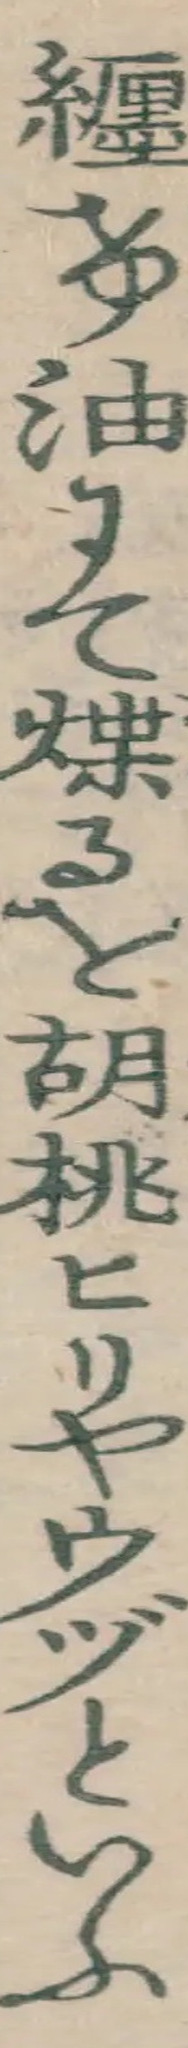纏け油にて煠るを胡桃ヒリヤウヅといふ
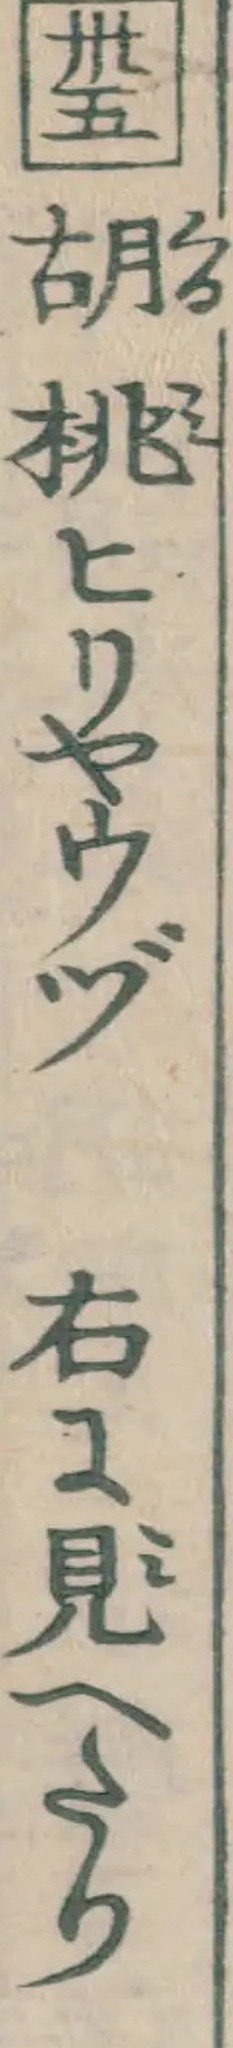卅五胡桃ヒリヤウヅ右に見へたり
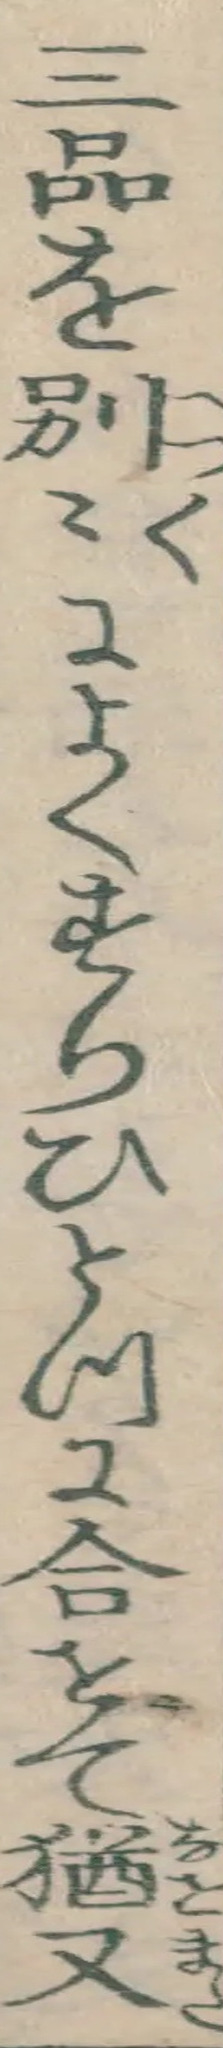三品を別々によくすりひとつに合せて猶又
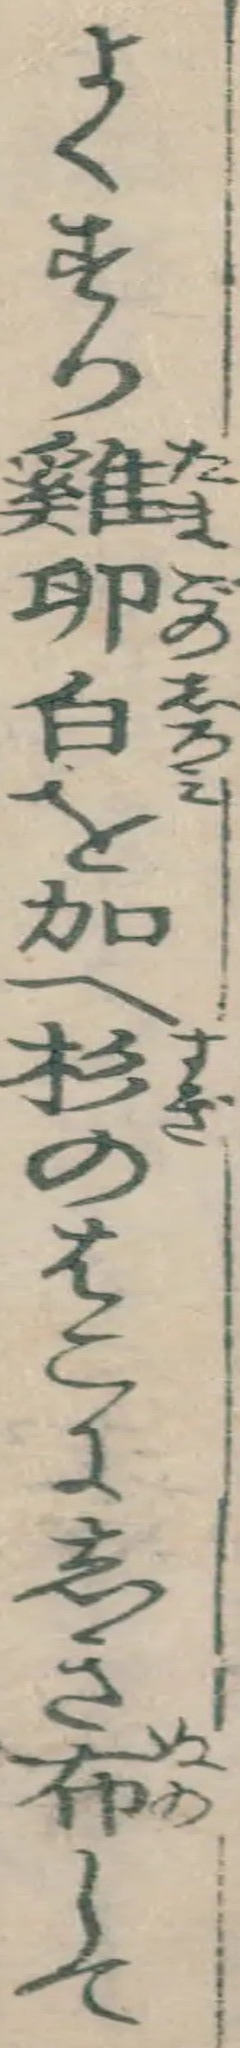よくすり鶏卵白を加へ杉のはこにしき布して
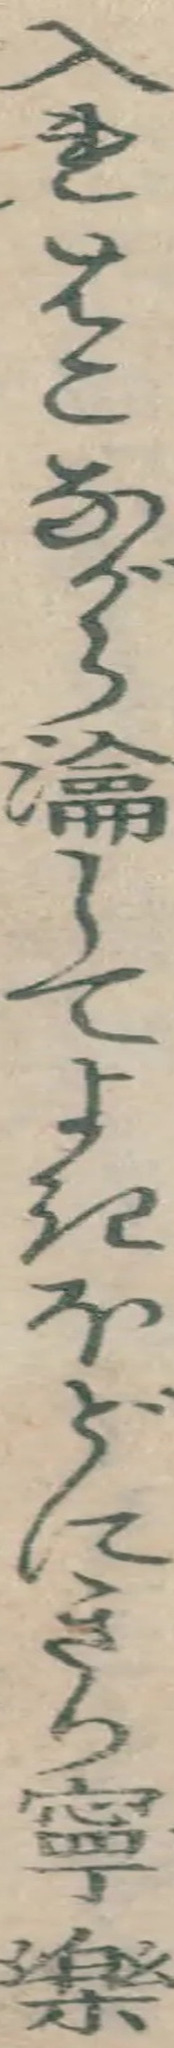入れはこながら瀹してよきほどにきり寧楽
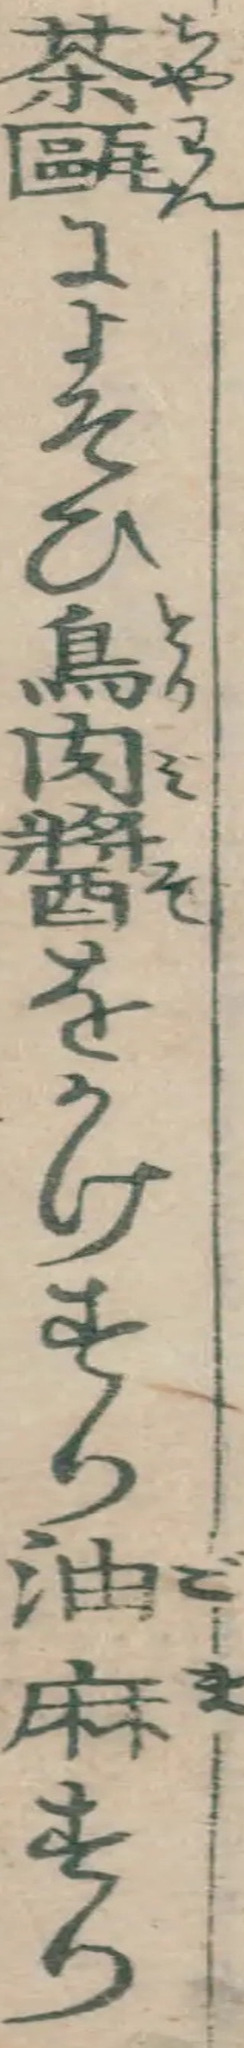茶甌によそひ鳥肉醤をかけすり油麻すり

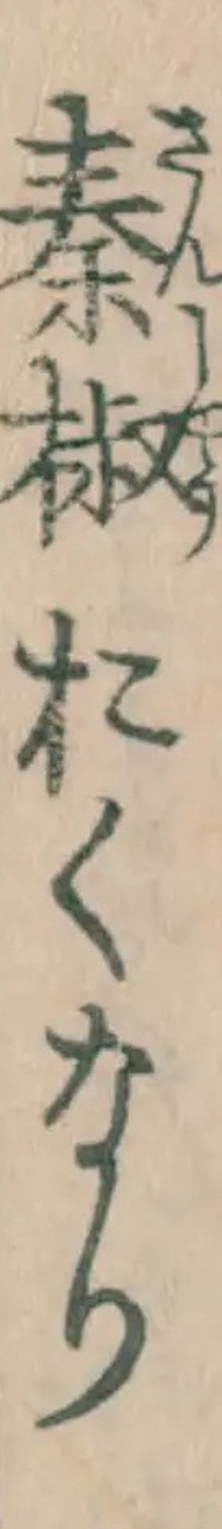秦椒おくなり
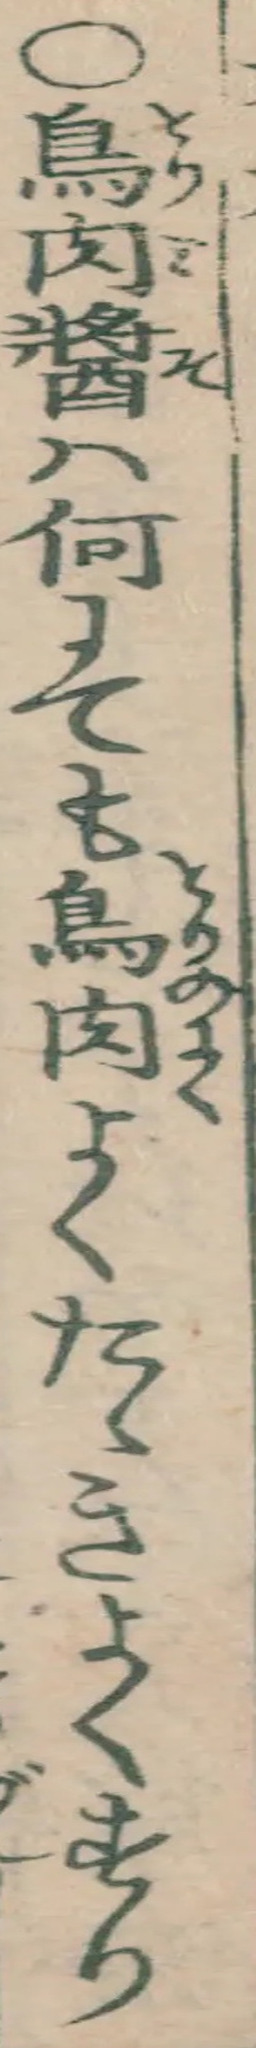○鳥肉醤は何にても鳥肉よくたゝきよくすり
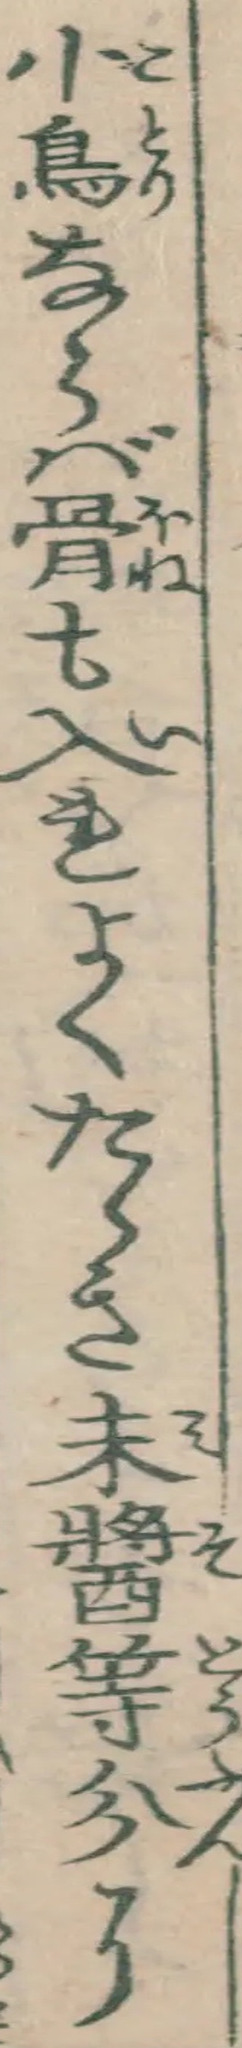小鳥ならば骨も入れよくたゝき未醤等分に
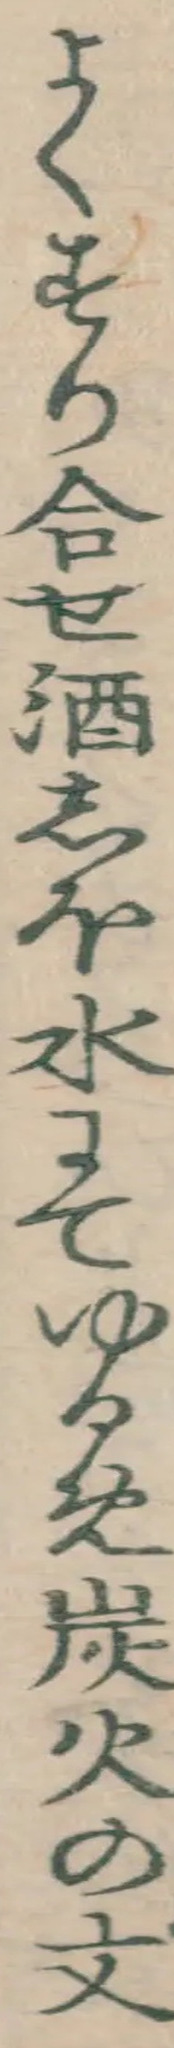よくすり合せ酒しほ水にてゆるめ炭火の文
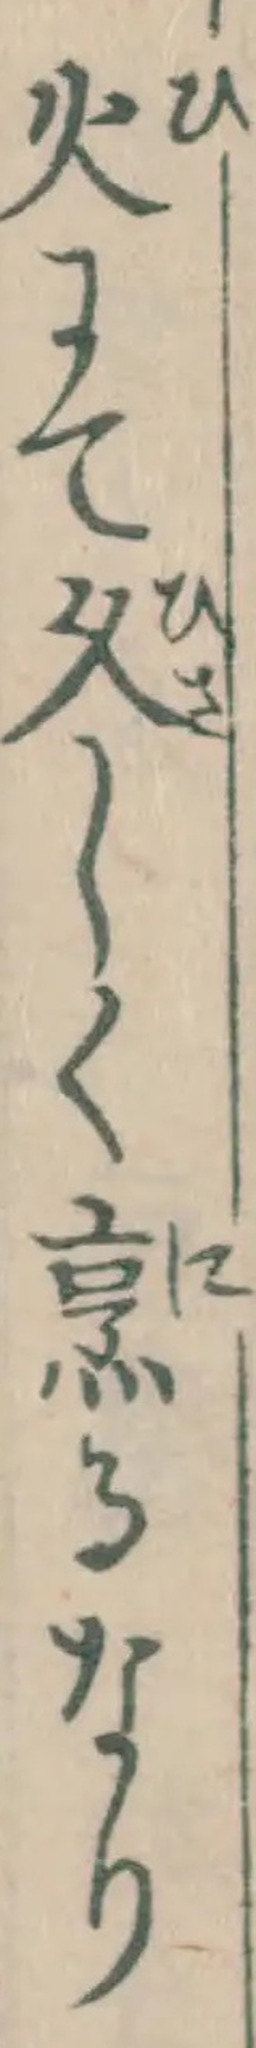火にて久しく烹るなり
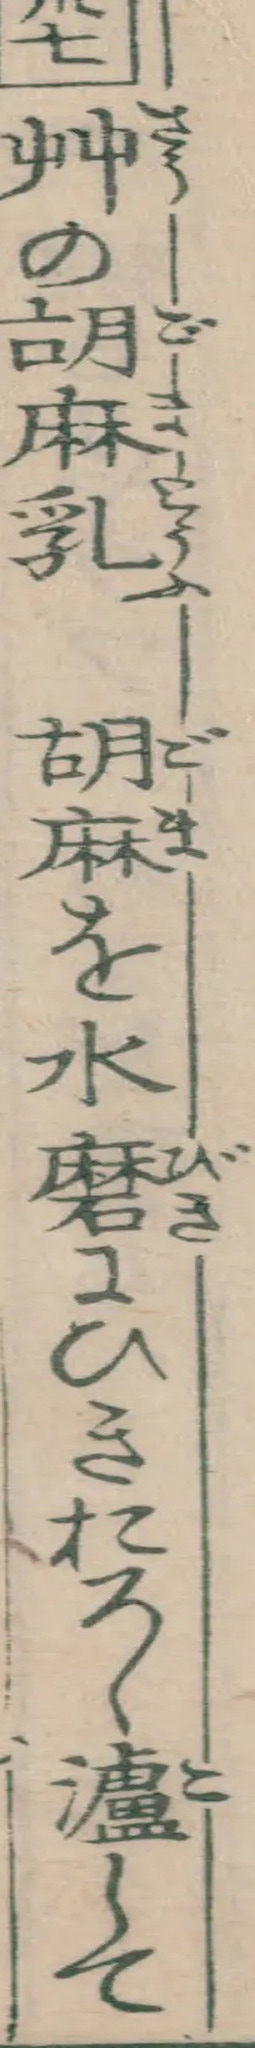卅七艸の胡麻乳胡麻を水磨にひきおろし瀘して
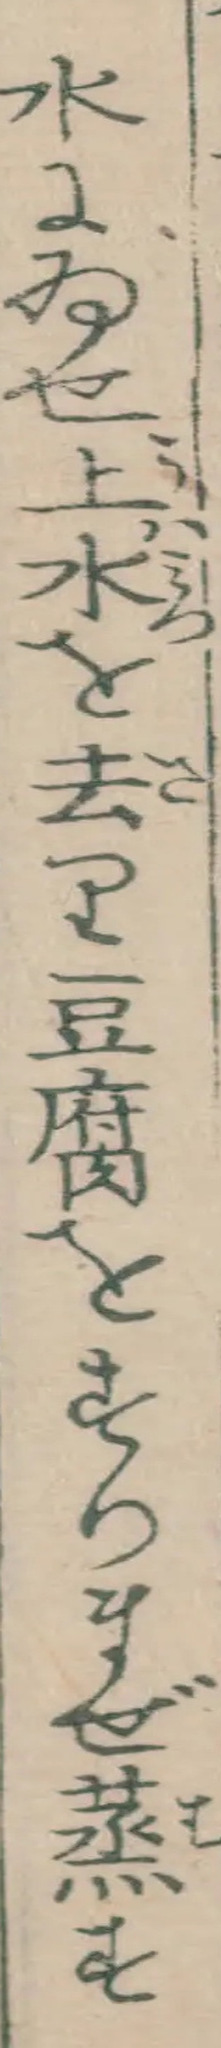水にゐせ上水を去り豆腐をすりまぜ蒸す
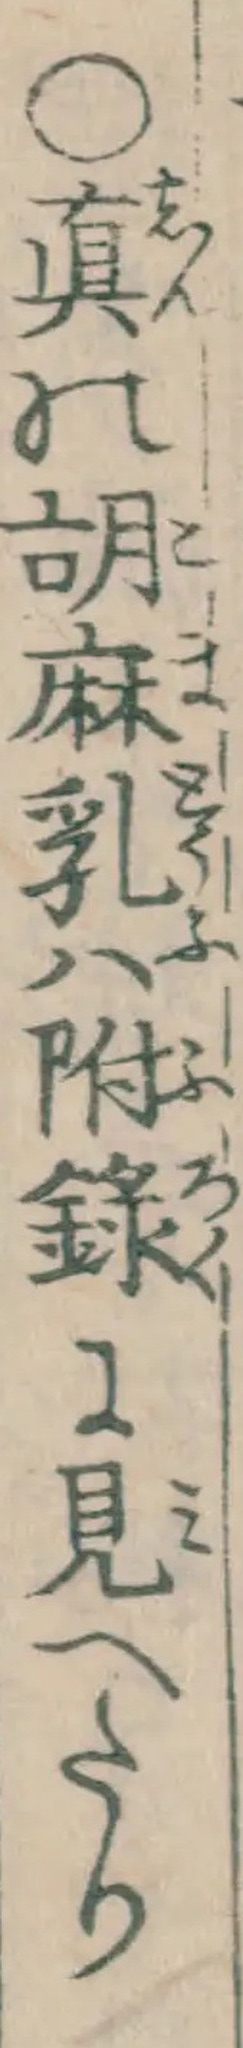○真の胡麻乳は附録に見へたり
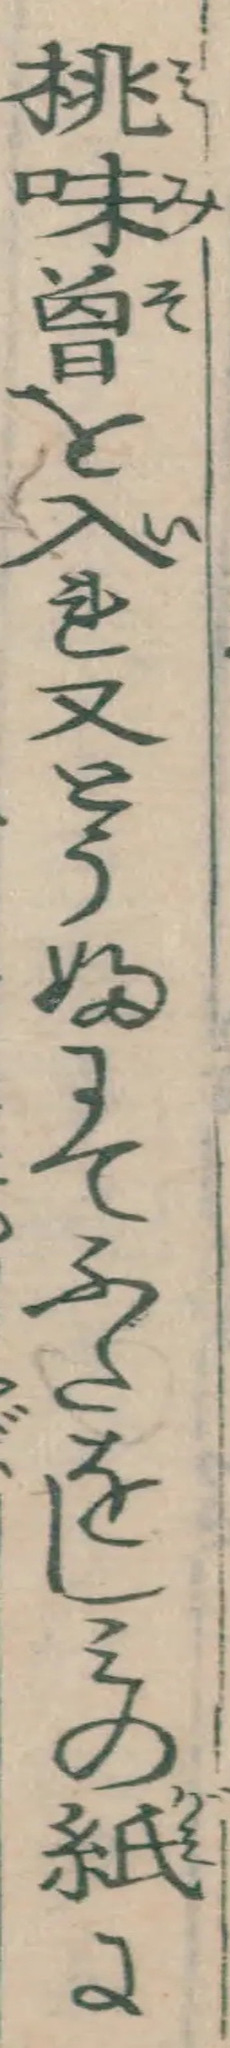桃味曽を入れ又とうふにてふたをしみの紙に
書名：豆腐百珍. 続編
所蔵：国立国会図書館 National Diet Library, JAPAN
